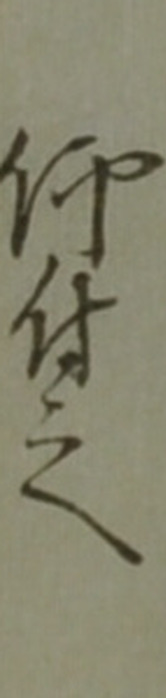仰付之
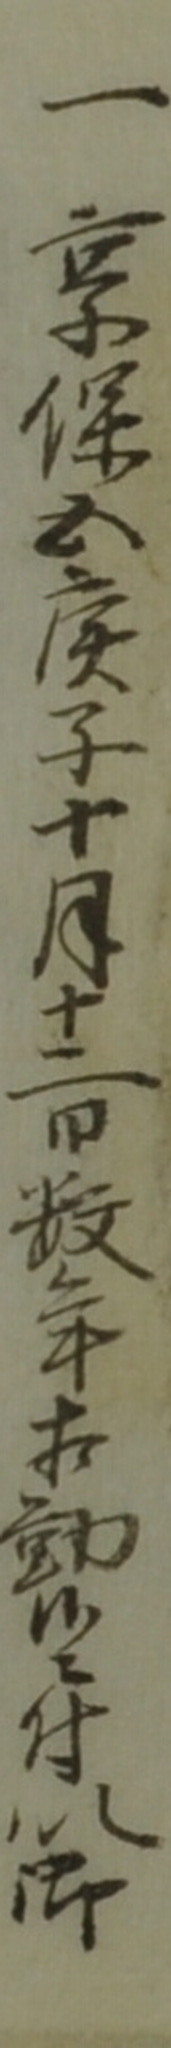一享保五庚子十月十二日数年相勤候ニ付以御
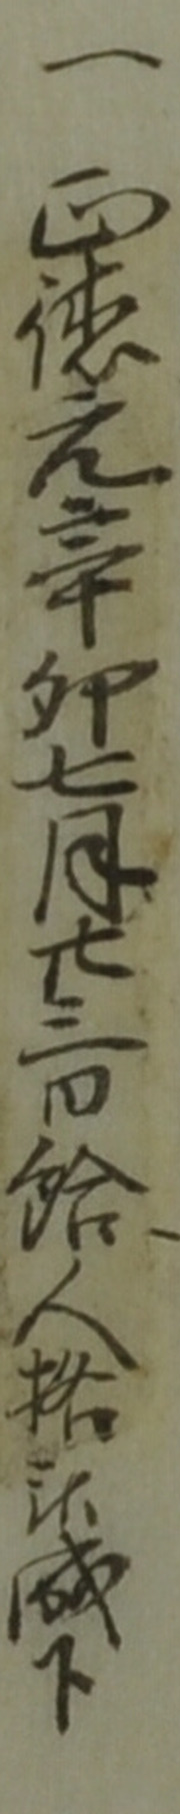一正徳元辛卯七月廿三日給人格被成下
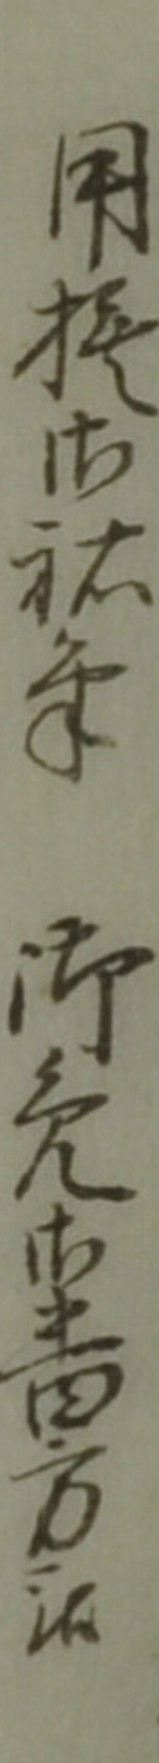用捨御祐筆御免御番方被
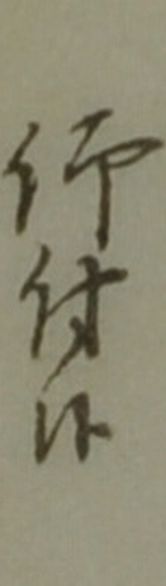仰付候
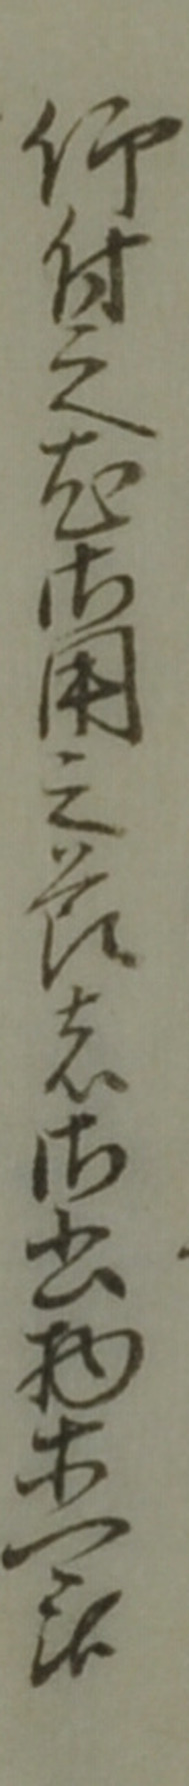仰付之尤御用之節者御書物等可被
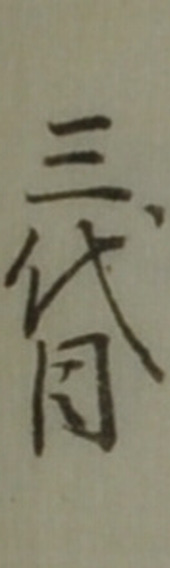三代目
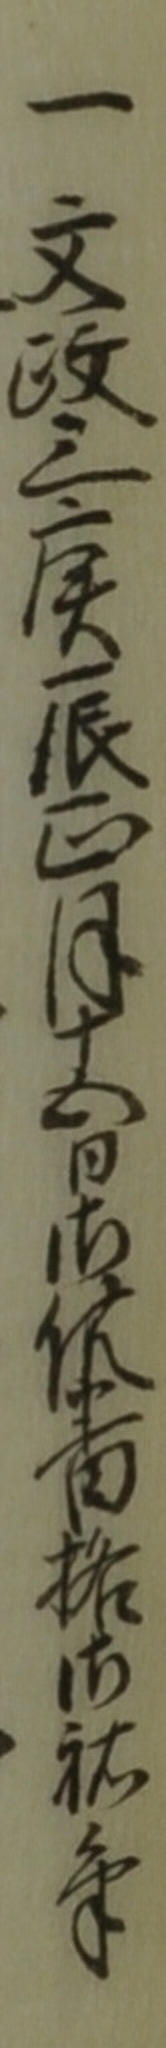一文政三庚辰正月十五日御供番御祐筆
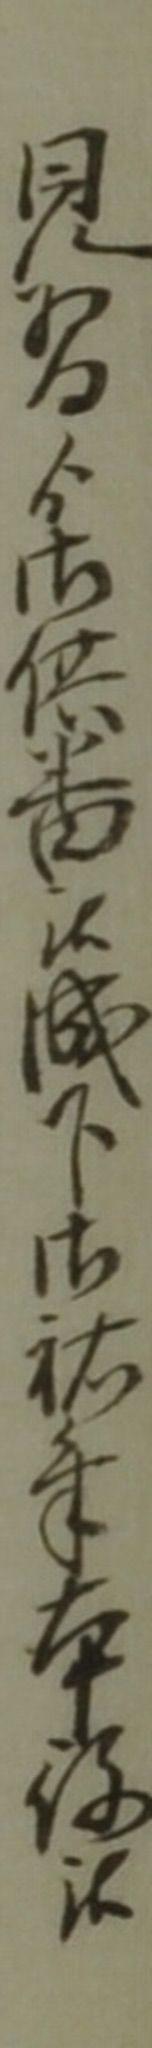見習より御供番被成下御祐筆本役被
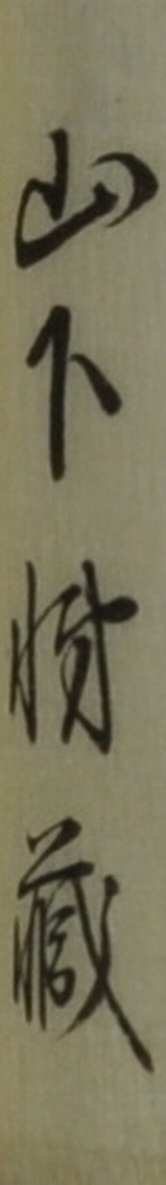山下悌蔵
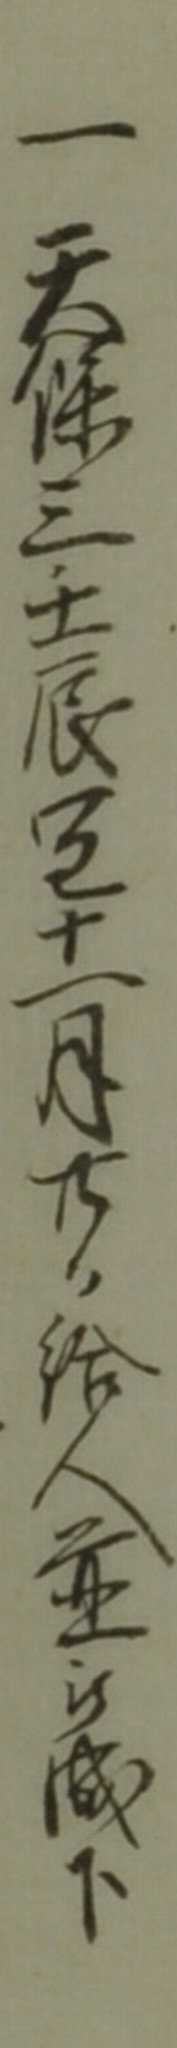一天保三壬辰閏十一月廿日給人並被成下
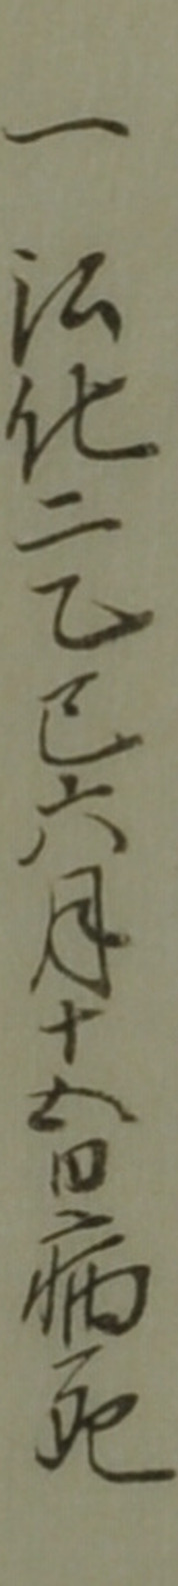一弘化二乙巳六月十五日病死
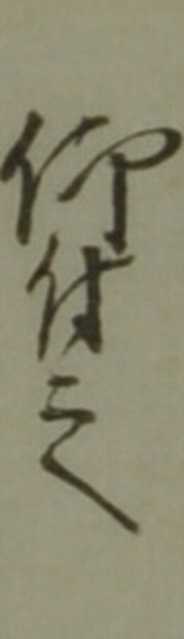仰付之
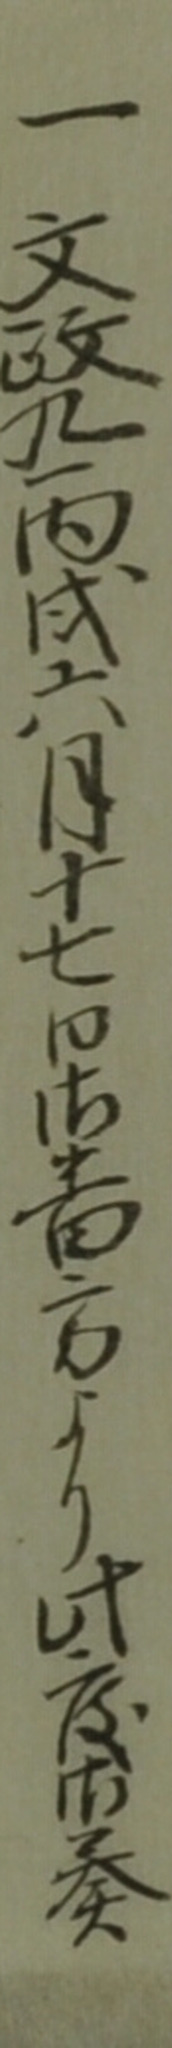一文政九丙戌六月十七日御番方より此度御奏
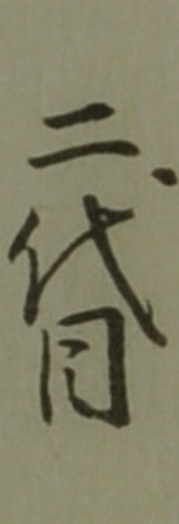二代目
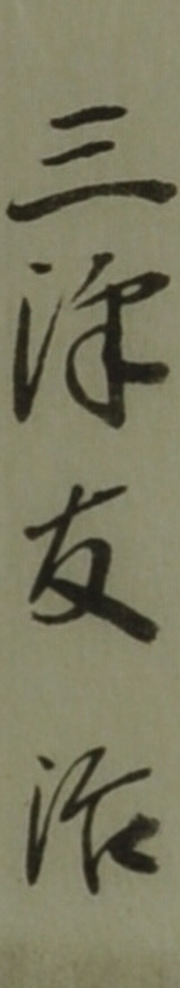三澤友治
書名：諸御役代々録（八）
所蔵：伊那市立高遠町図書館・合同会社AMANE
